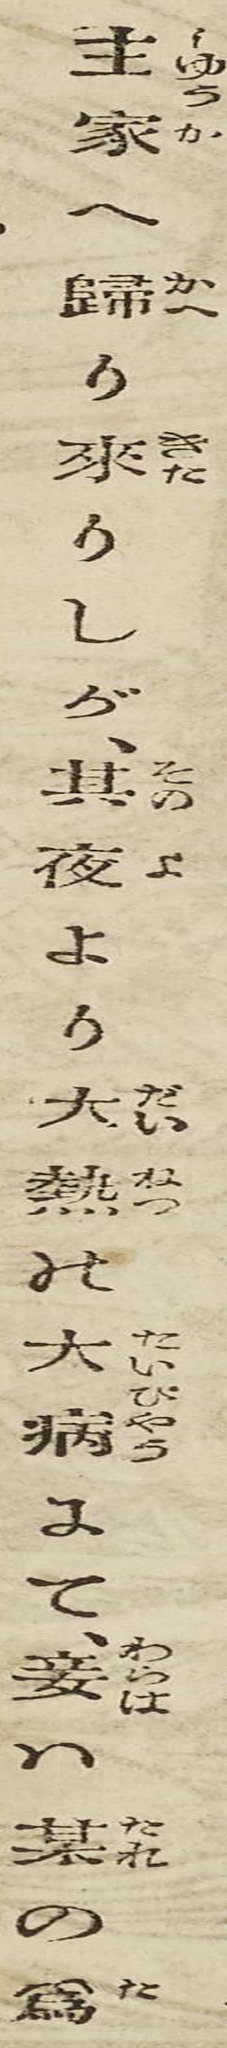主家へ帰り来りしが、其夜より大熱の大病にて、妾は某の為
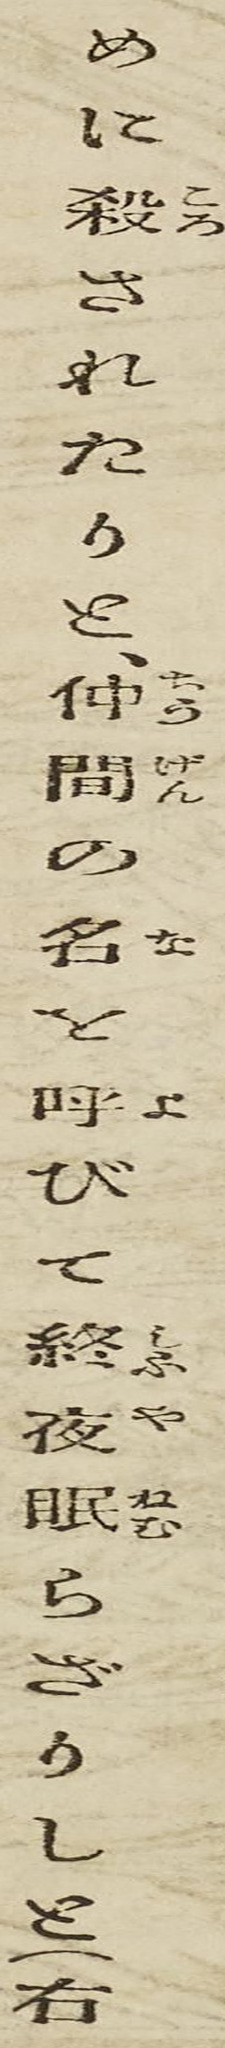めに殺されたりと、仲間の名を呼びて終夜眠らざりしと（右
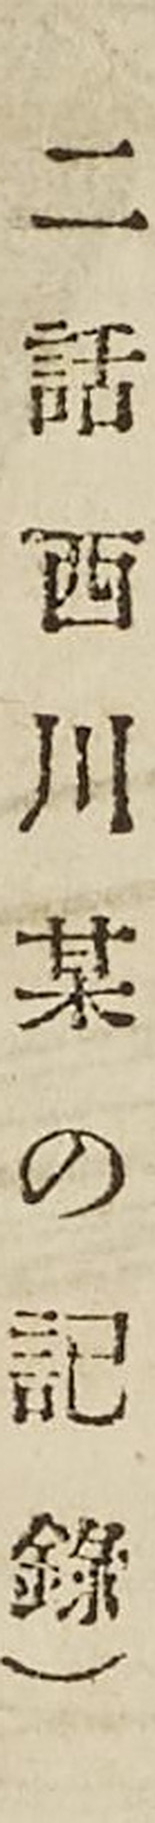二話西川某の記録）
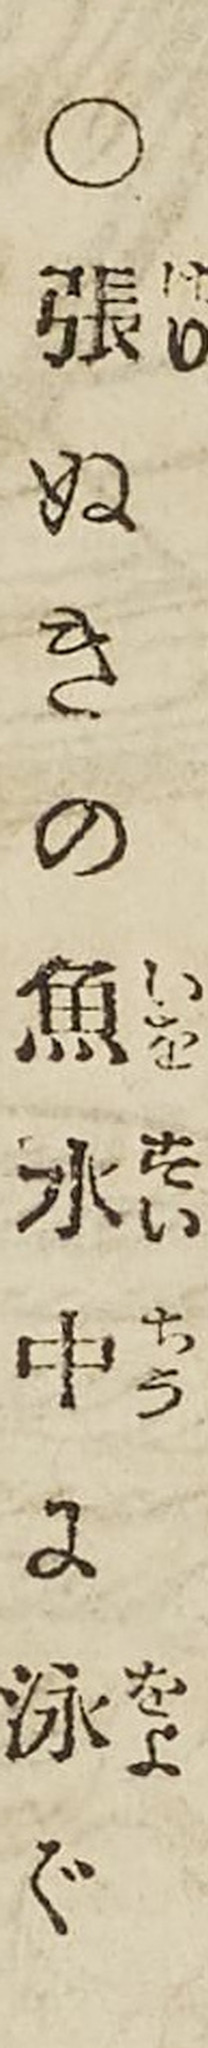○張ぬきの魚水中に泳ぐ
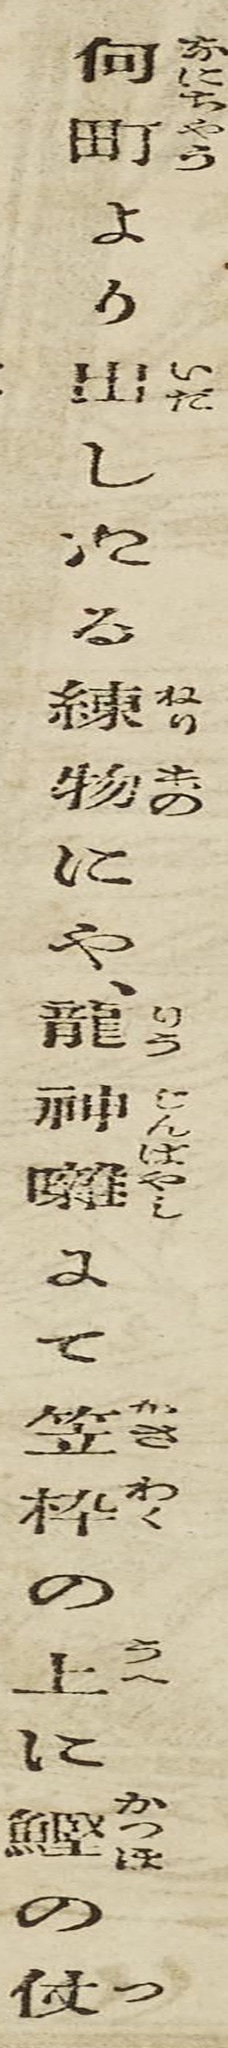何町より出したる練物にや、龍神囃にて笠枠の上に鰹の杖
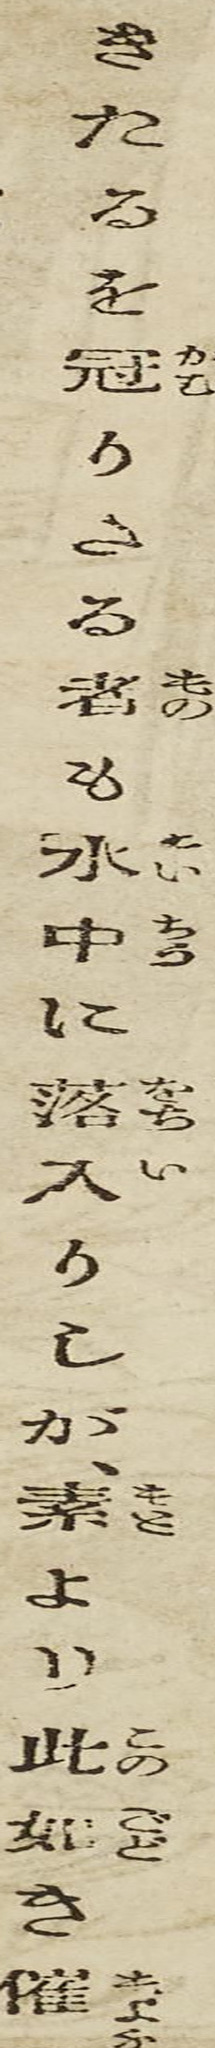きたるを冠りたる者も水中に落入りしが、素より此如き催
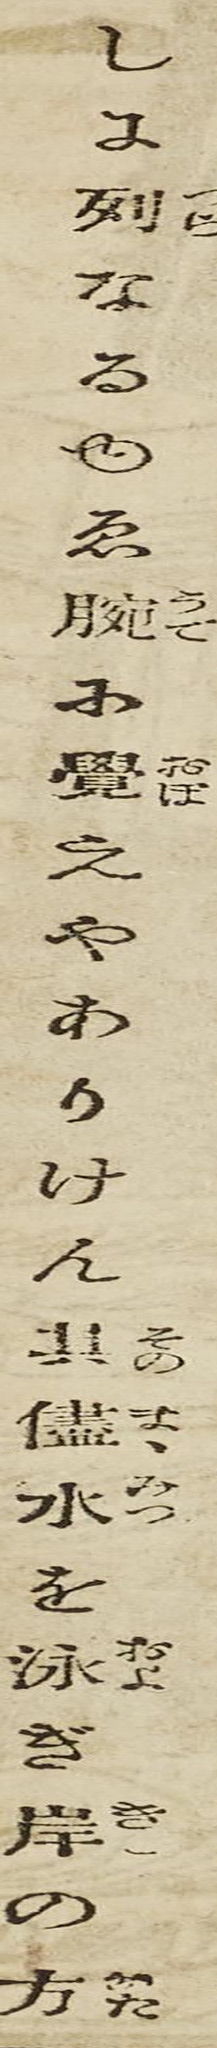しに列なるゆゑ腕に覚えやありけん其侭水を泳ぎ岸の方
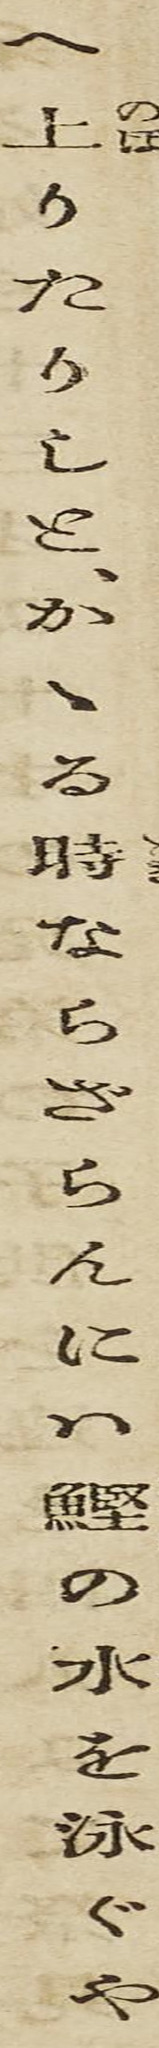へ上りたりしと、かゝる時ならざらんには鰹の水を泳ぐや
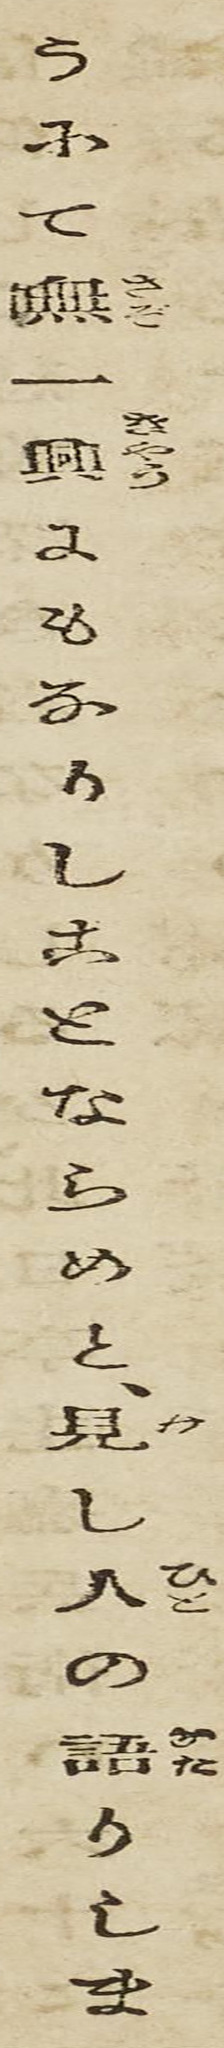うにて嘸一興にもなりしことならめと、見し人の語りしま
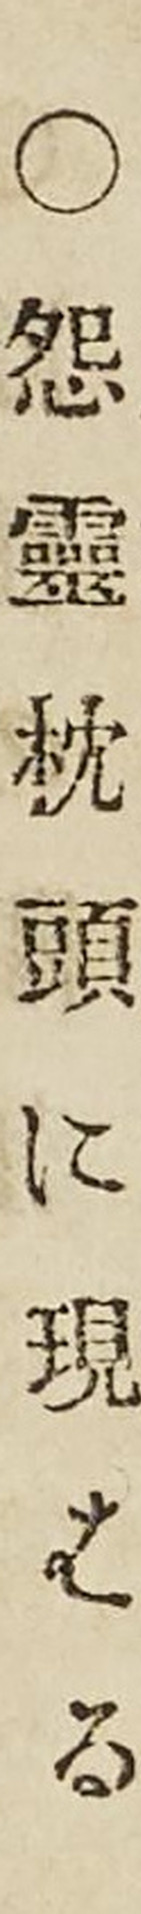○怨霊枕頭に現はる
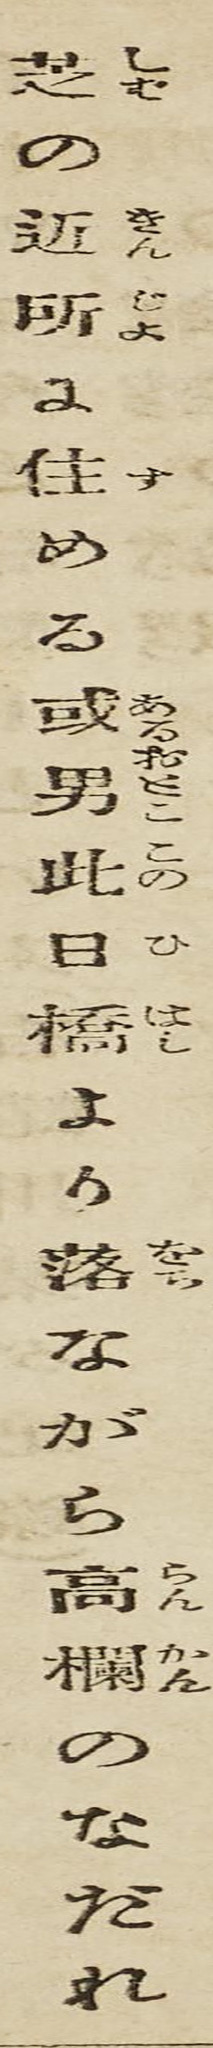芝の近所に住める或男此日橋より落ながら高欄のなだれ
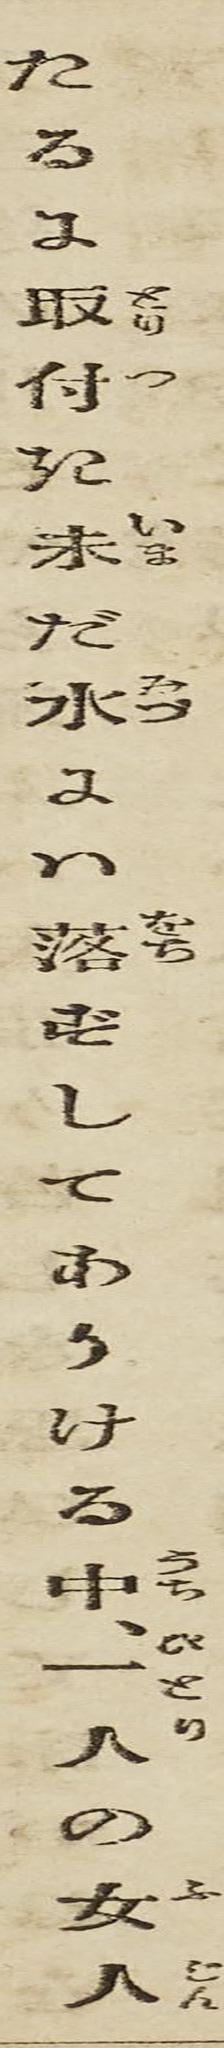たるに取付き未だ水には落ずしてありける中、一人の女人
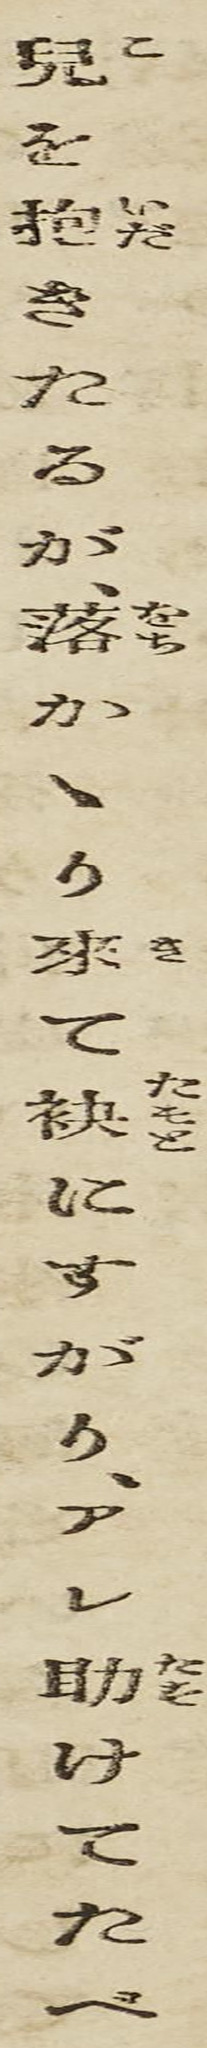児を抱きたるが、落かゝり来て袂にすがり、アレ助けてたべ
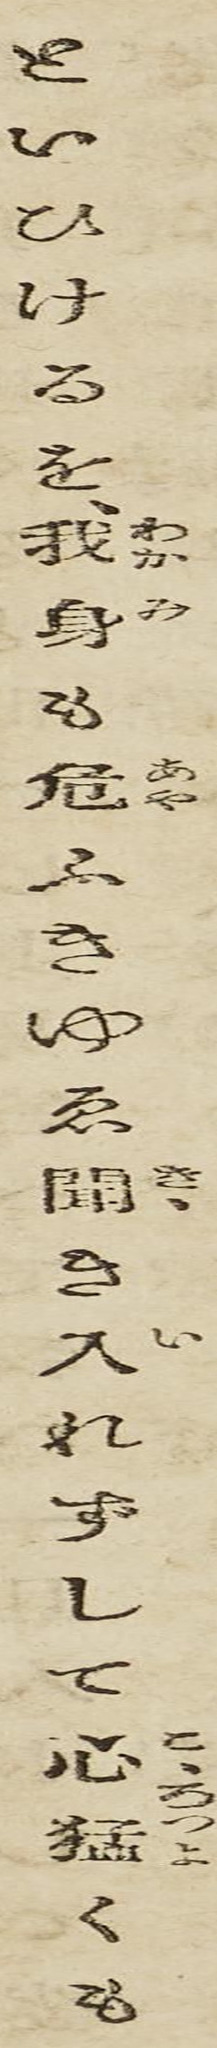といひけるを、我身も危ふきゆゑ聞き入れずして心猛くも
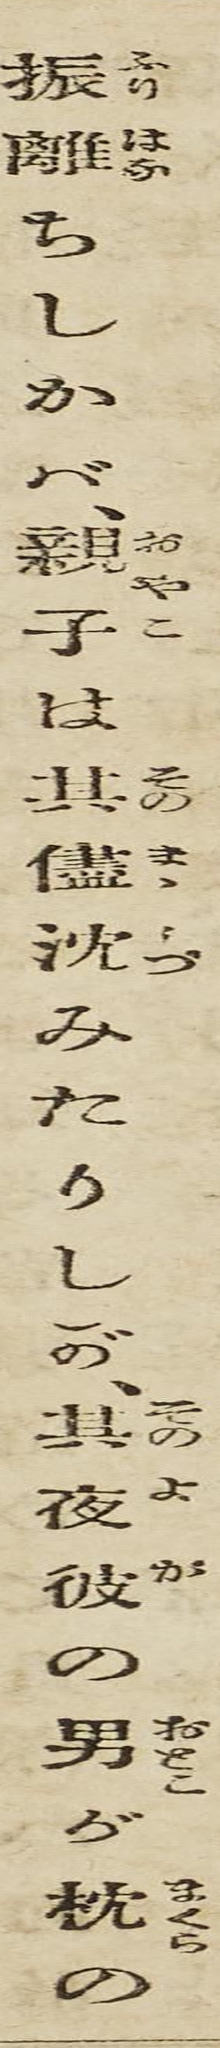振離ちしかば、親子は其侭沈みたりしが、其夜彼の男が枕の
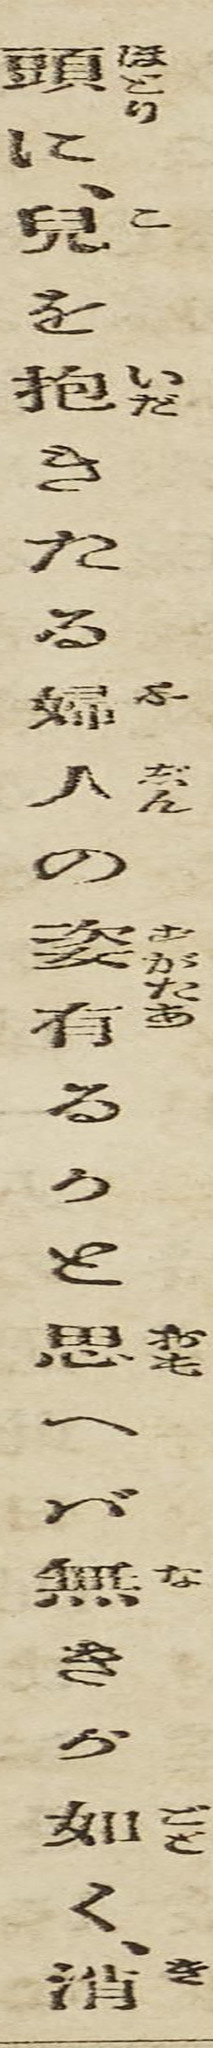頭に、児を抱きたる婦人の姿有るかと思へば無きが如く、消
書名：永代惨話　文化の夢　全
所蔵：東京大学地震研究所図書室 Earthquake Research Institute Library, The University of Tokyo, JAPAN
